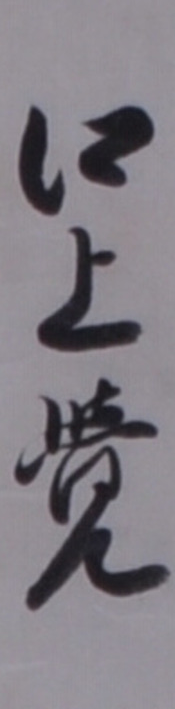口上覚
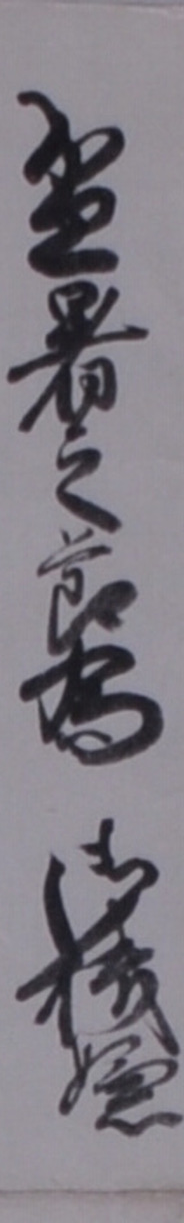盛暑之節為御機嫌
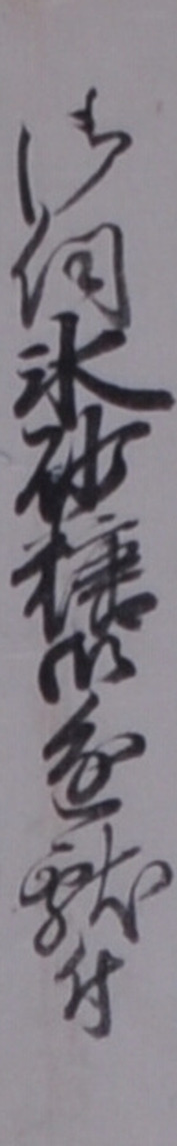御伺氷砂糖御進献付
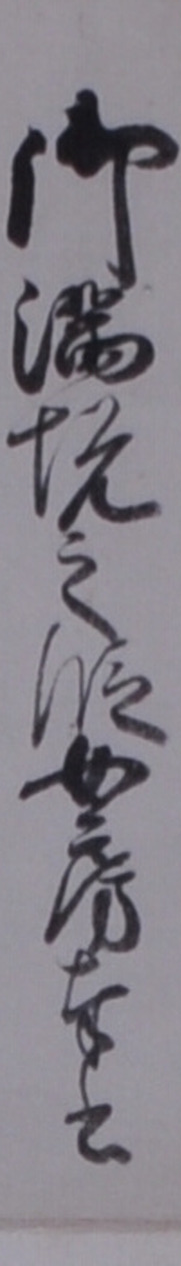御満悦之段女房奉書
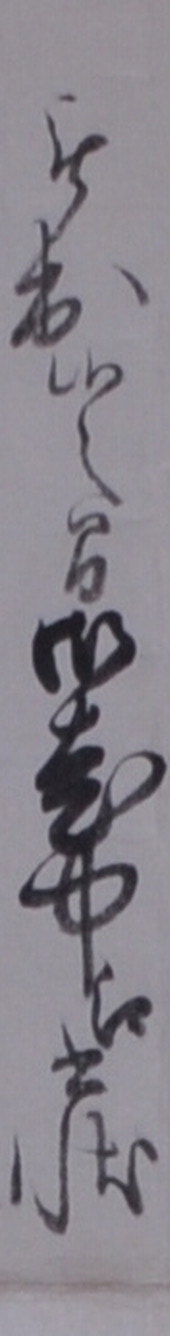被出候之間御老中え書状
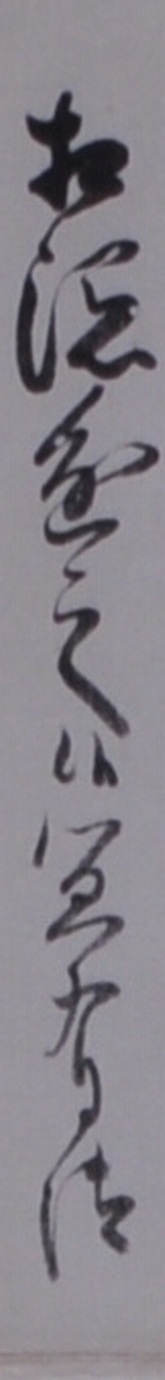相認進之候宜有御
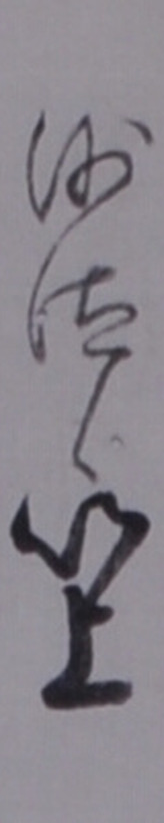沙汰候以上
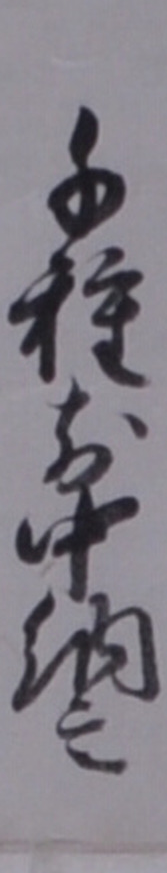千種前中納言
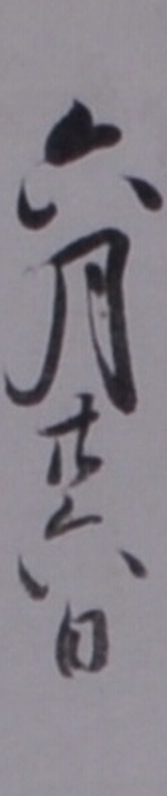六月廿六日
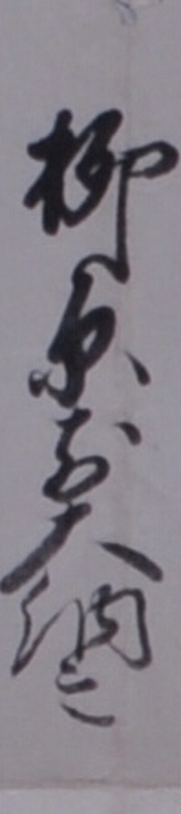柳原前大納言
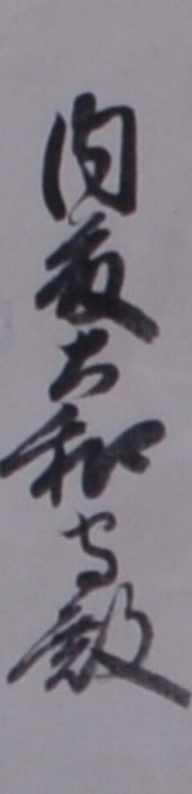内藤大和守殿
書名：口上覚
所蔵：伊那市立高遠町図書館・合同会社AMANE
